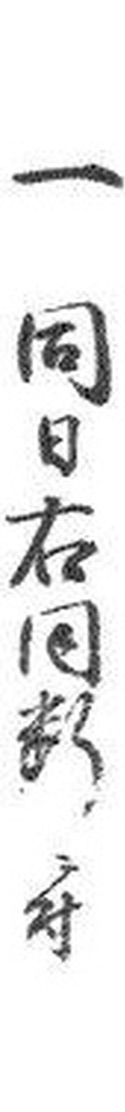一同日右同断ニ付
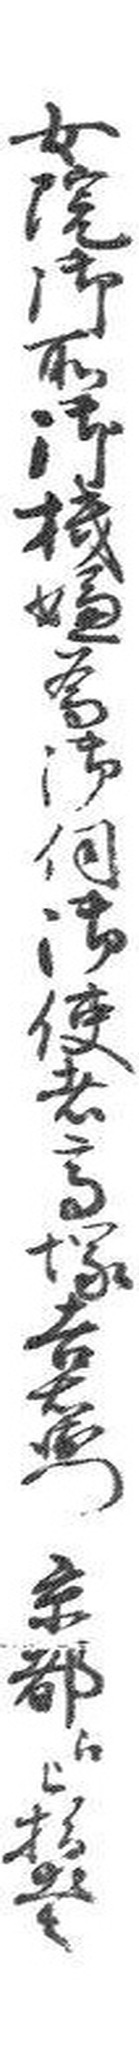女院御所御機嫌為御伺御使者高塚吉右衛門京都江被指出之
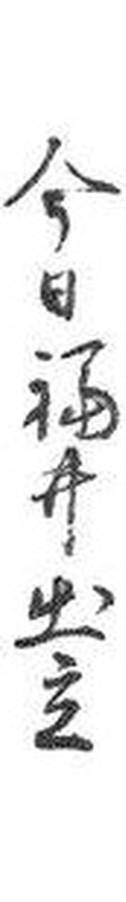今日福井出立
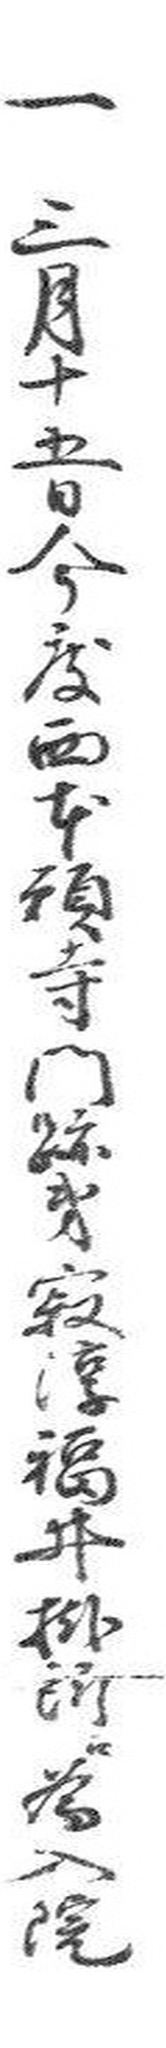一三月十五日今度西本願寺門跡弟寂淳福井掛所江為入院
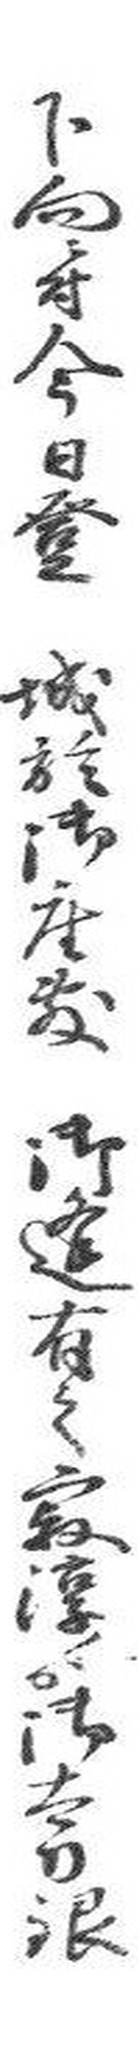下向ニ付今日登城於御座敷御逢有之寂淳ゟ御太刀銀
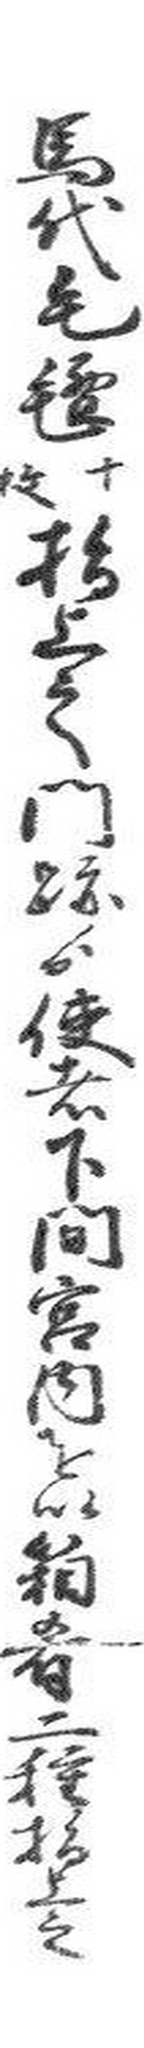馬代毛氊十枚指上之門跡ゟ使者下間宮内を以箱肴二種指上之
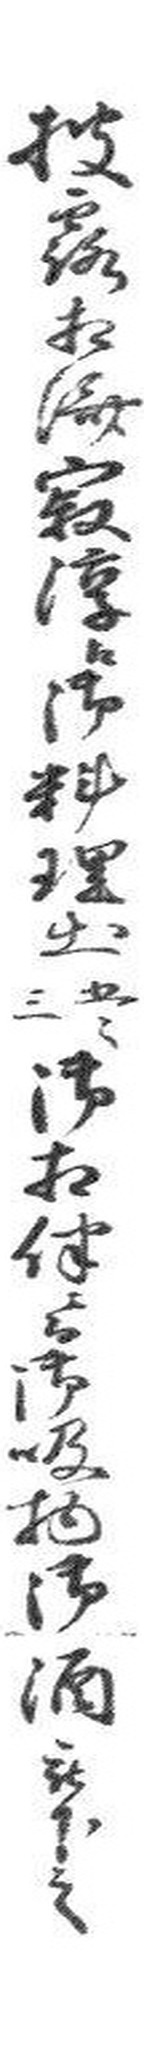披露相済寂淳江御料理出五々三御相伴ニ而御吸物御酒被下之
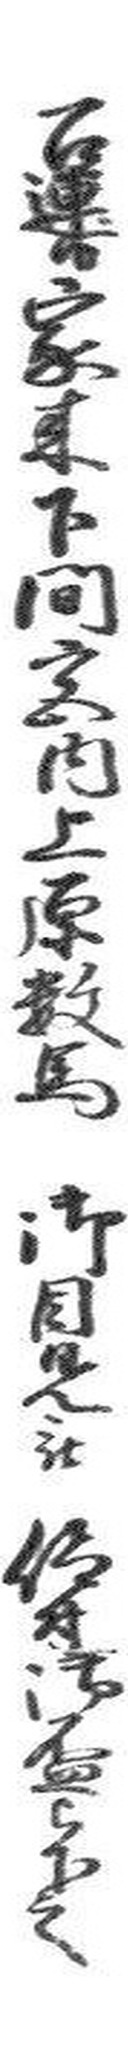召連候家来下間宮内上原数馬御目見被仰付御盃被下之
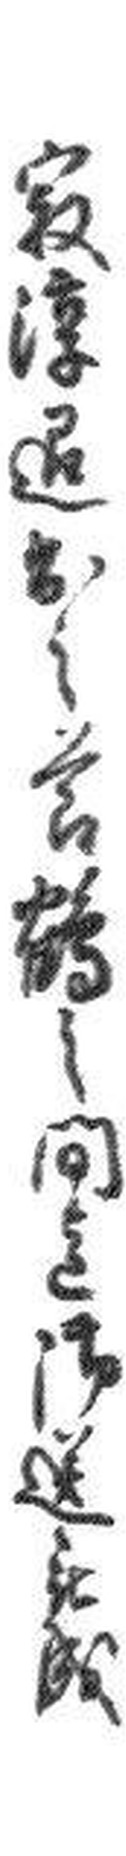寂淳退出之節鶴之間迄御送被成
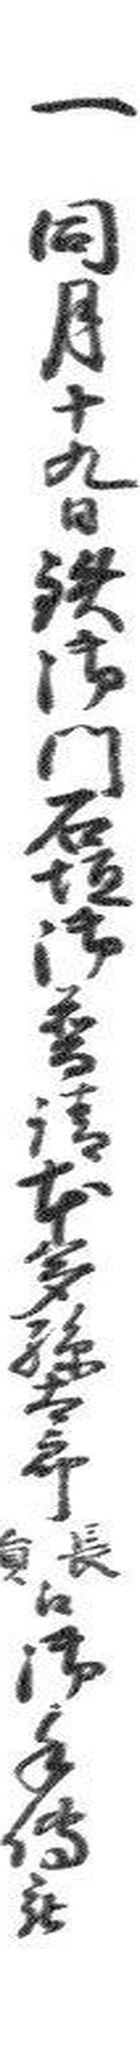一同月十九日鉄御門石垣御普請本多孫太郎長員江御手伝被
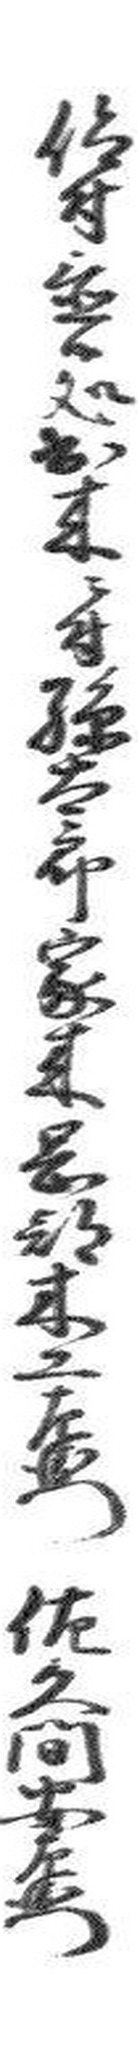仰付置候処出来ニ付孫太郎家来岡部杢左エ門佐久間安左衛門
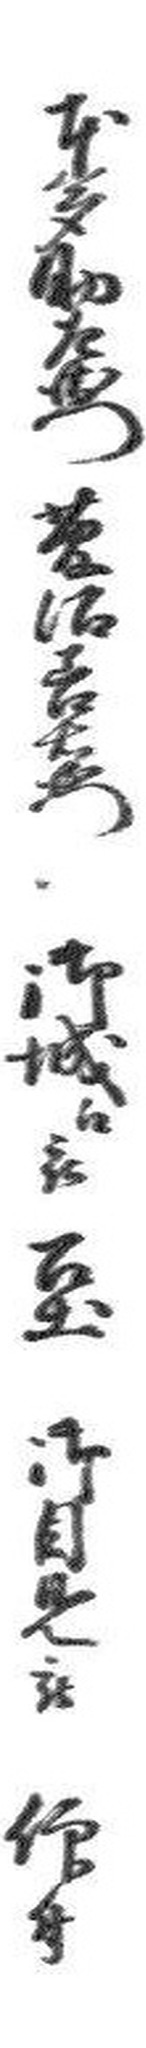本多助左衛門菅沼吉右衛門御城江被召出御目見被仰付
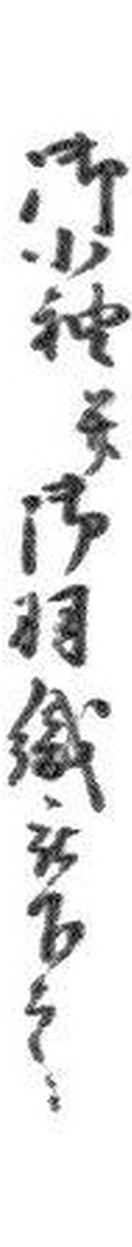御小袖并御羽織被下之
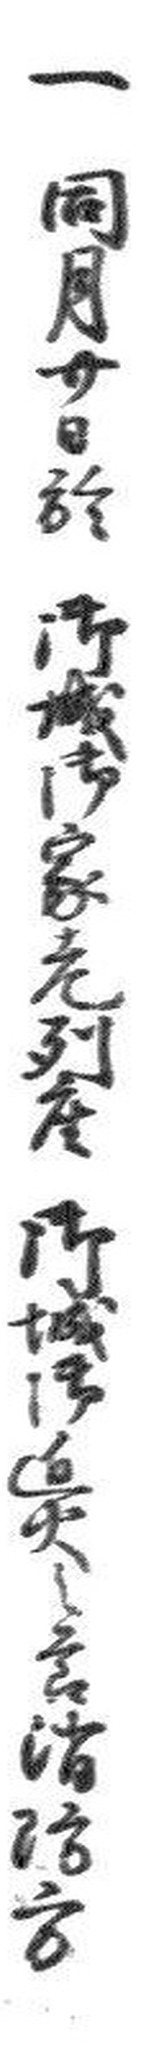一同月廿日於御城御家老列座御城御近火之節消防方
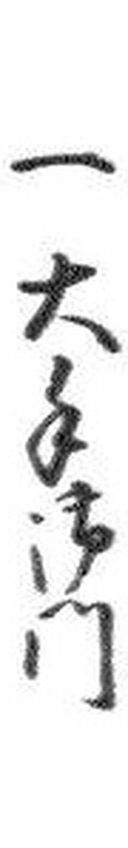一大手御門
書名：家譜 八 光通公 従寛文十年到同十二年
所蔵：福井県文書館 Fukui Prefectural Archives
